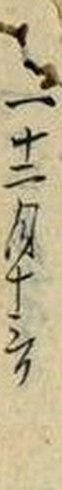一十二月十三日
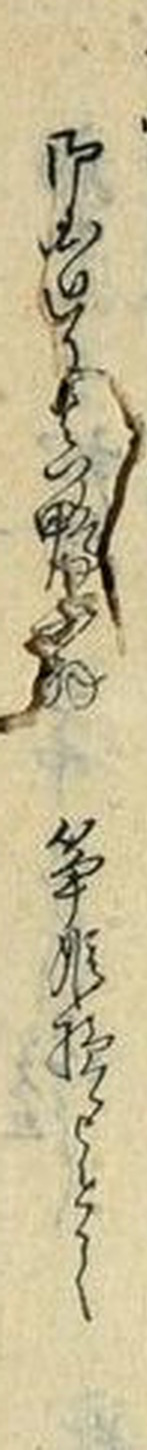御国廻り真鴨一羽箏姫様へ被進之

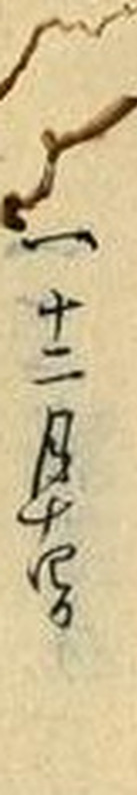一十二月十六日
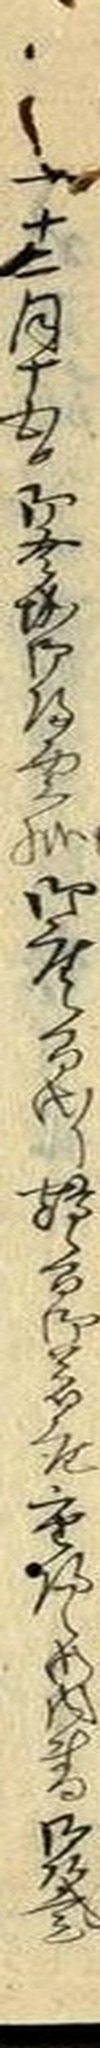一十二月十五日御登城御帰殿掛御座之間代り鶴之間御着座重陽之御内書御頂戴
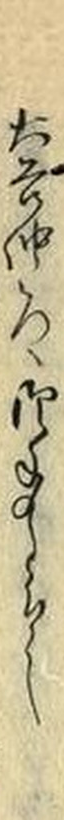大谷仲右衛門へ御手のし被下之
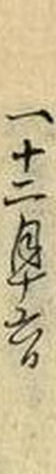一十二月十六日
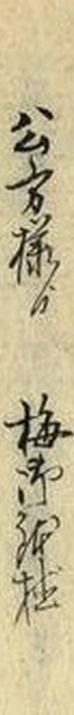公方様ゟ梅御鉢植
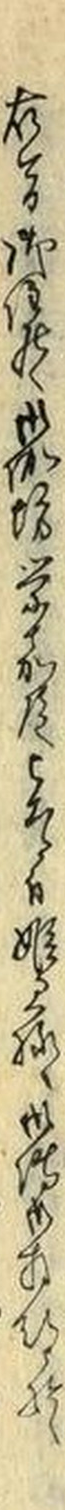右今日御住居へ御伽坊栄嘉殿被出候ニ付姫君様へ御伝御拝領被遊之
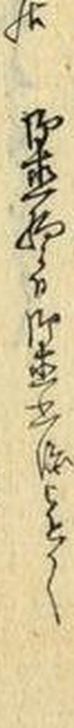御直約ニ付御直書添被進之
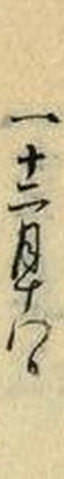一十二月十六日
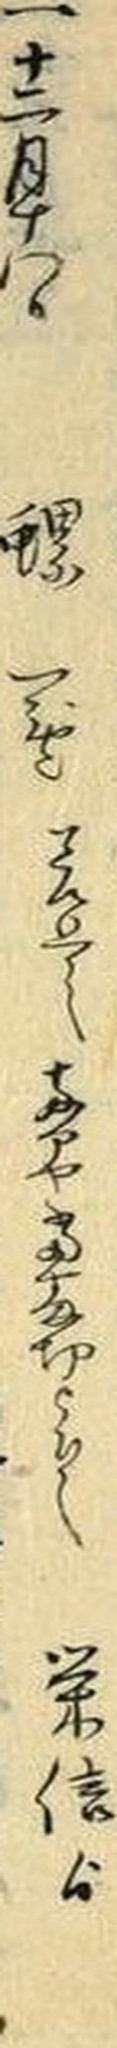一十二月十八日螺一台差上之両部や当番切被下之栄信ゟ
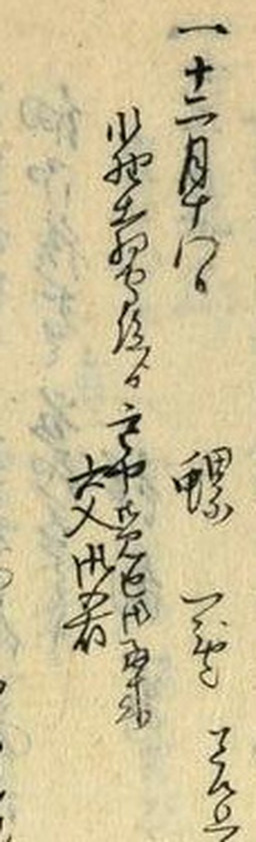水野出羽守殿ゟ寒中御見廻御到来
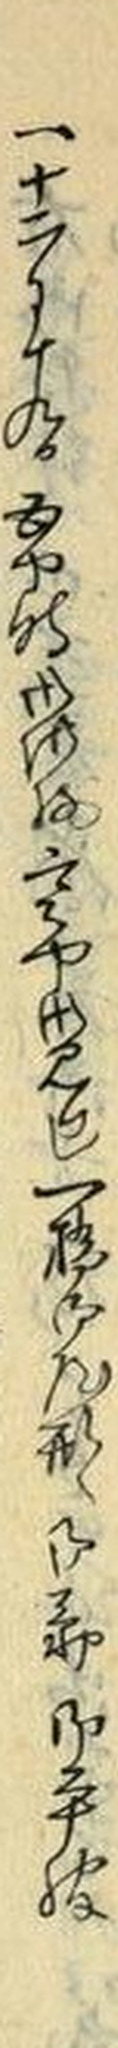一十二月十九日五半時御供揃寒中御見廻一橋御屋形へ御勤御平服
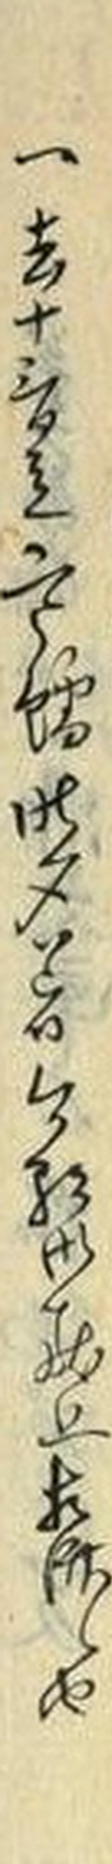一去十三日立寒鱈昨夕着今朝御献上相済候由
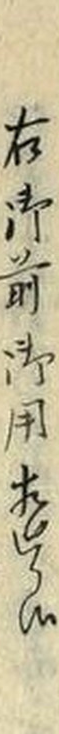右御前御用相廻り候
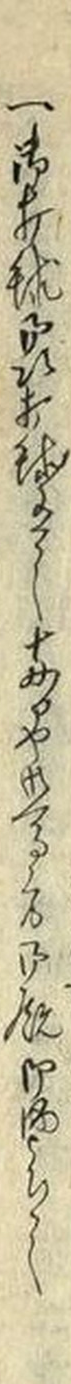一御打毬御次打毬有之両部や御馬方御厩御酒被下之
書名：少傅日録抄（斉承付側向頭取日記、在府）
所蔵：福井県文書館 Fukui Prefectural Archives
